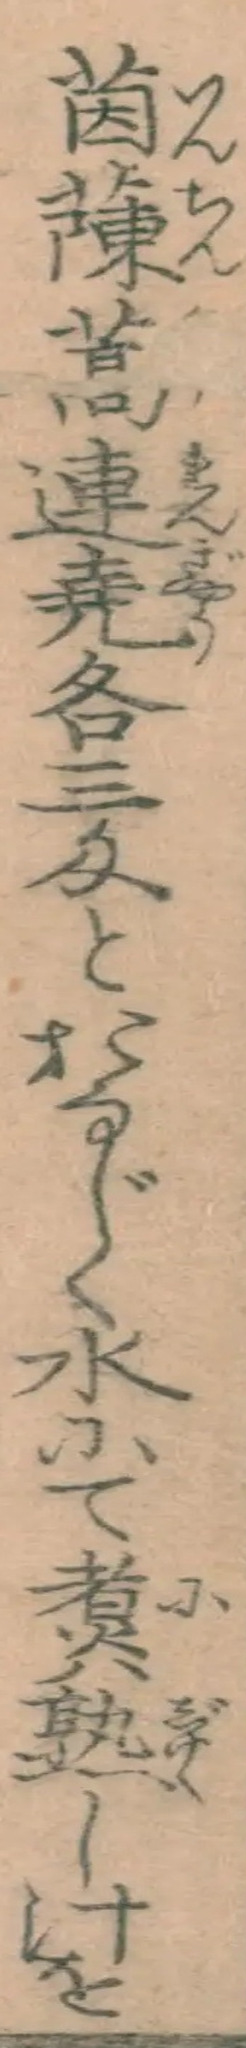茵蔯蒿連堯各三匁とおなじく水にて煮熟し汁を
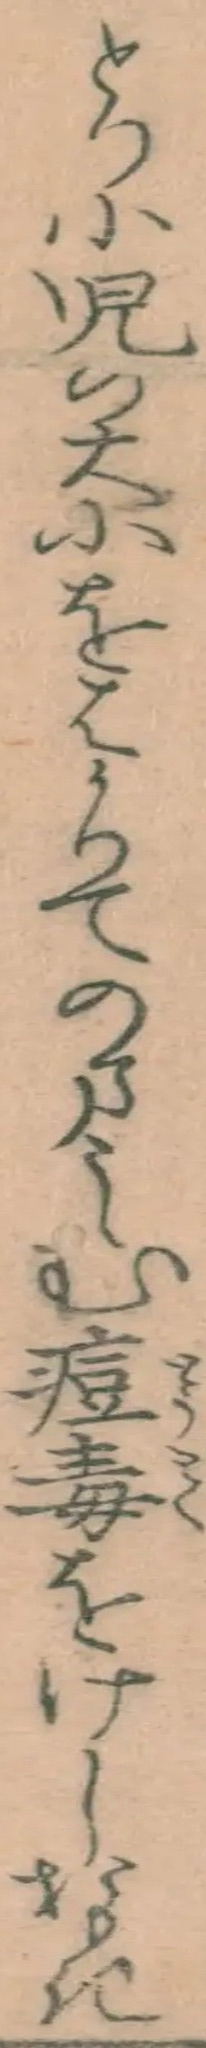とり小児の大小をはかりてのましむ痘毒をけしおもき
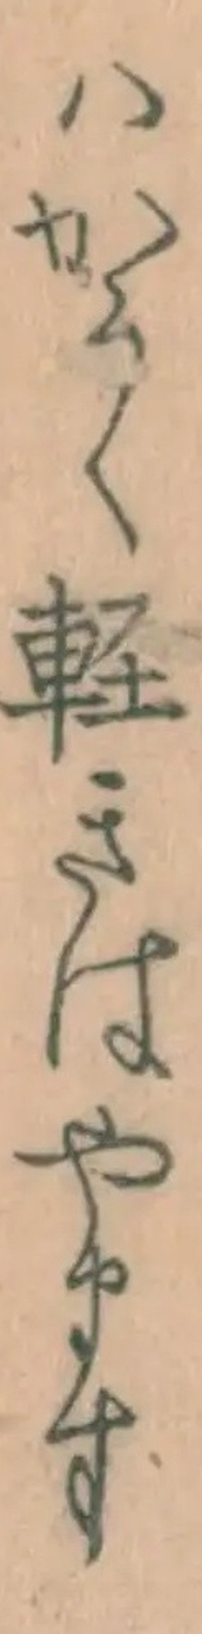はかるく軽きはやます
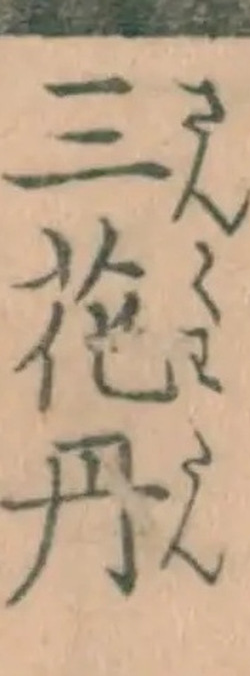三花丹
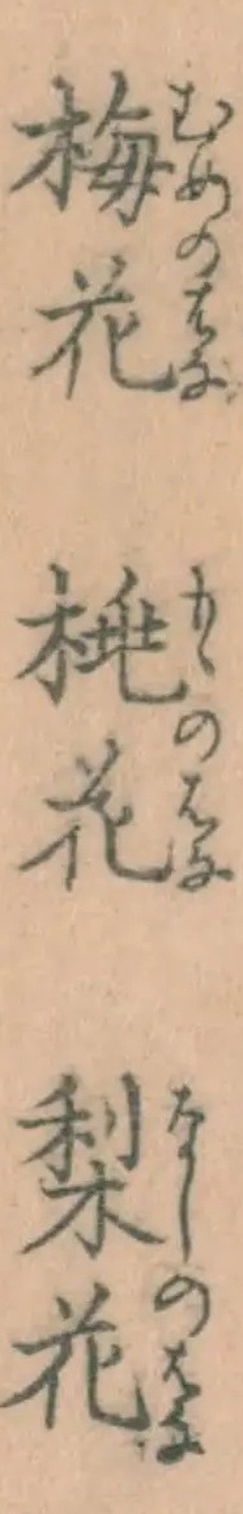梅花▢花梨花
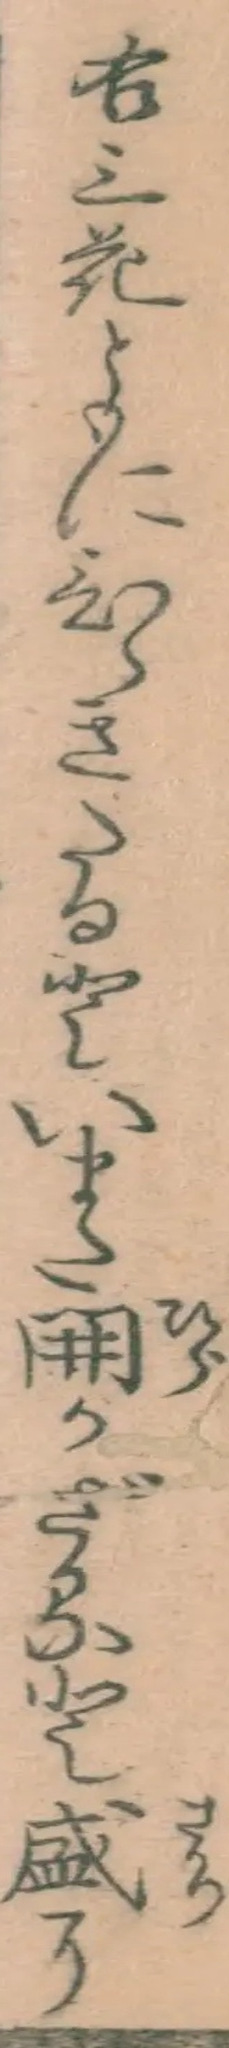右三花ともにひらきたるといまた開かざると盛に
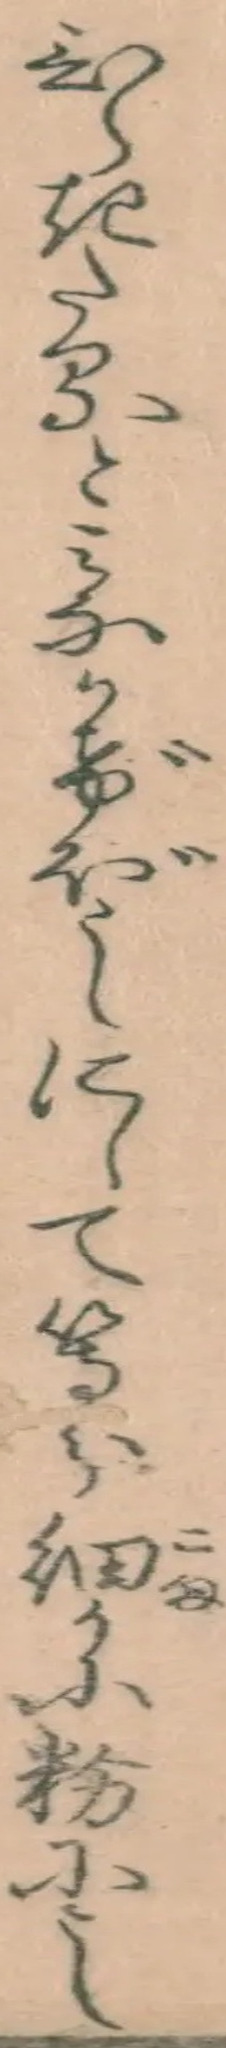ひらきたるとみなかげぼしにして等分細かに粉にし
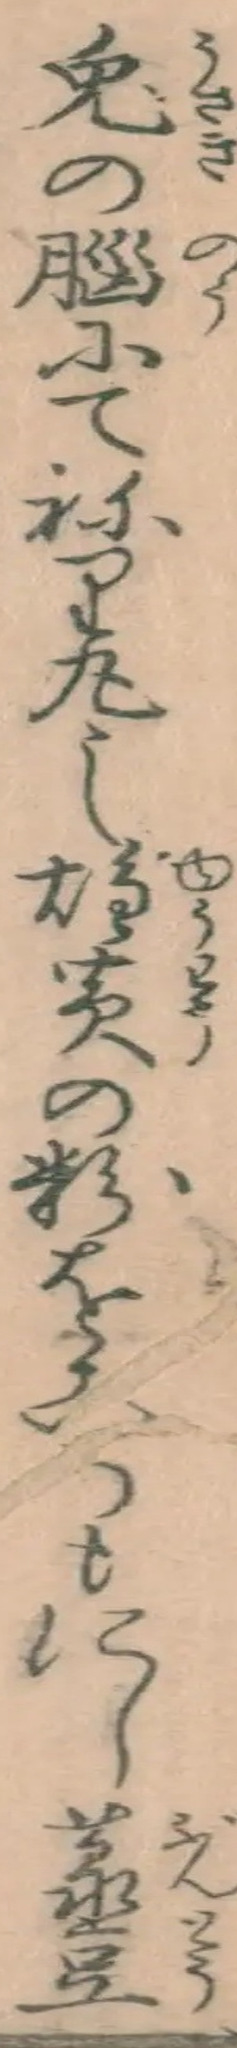兎の脳にてねり丸し雄黄の粉をころもにし菉豆
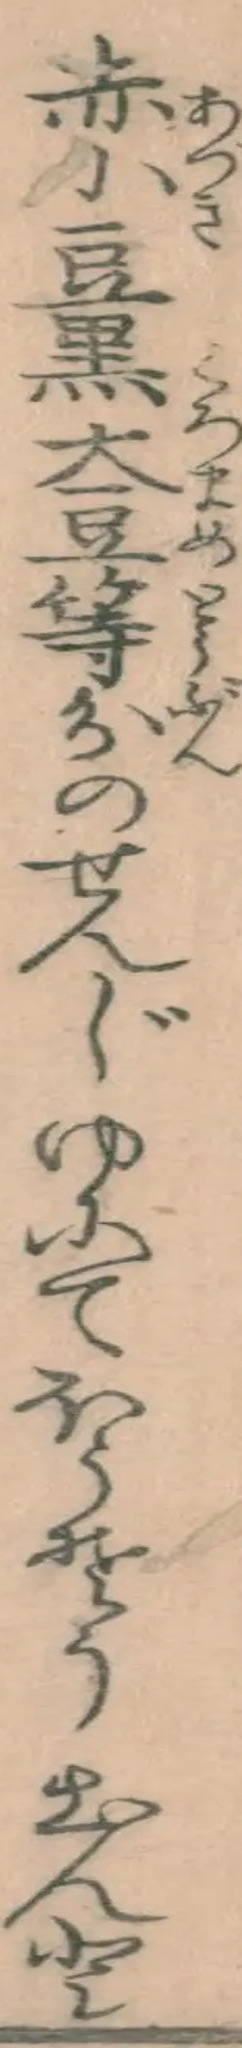赤小豆黒大豆等分のせんじゆにてほうそう出んと
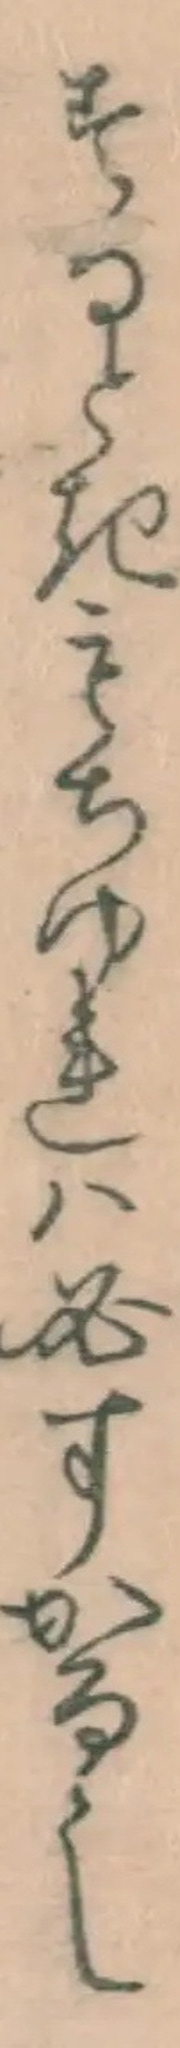するときもちゆれは必すかるし
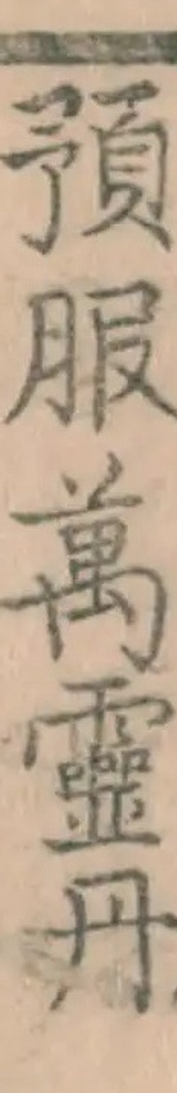預服万霊丹

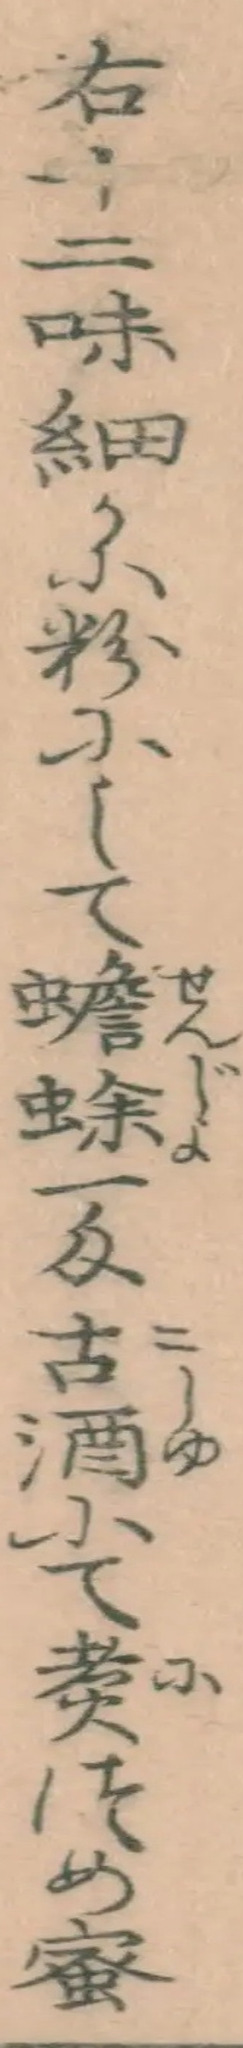右十二味細かに粉にして蟾蜍一匁古酒にて煮つめ蜜
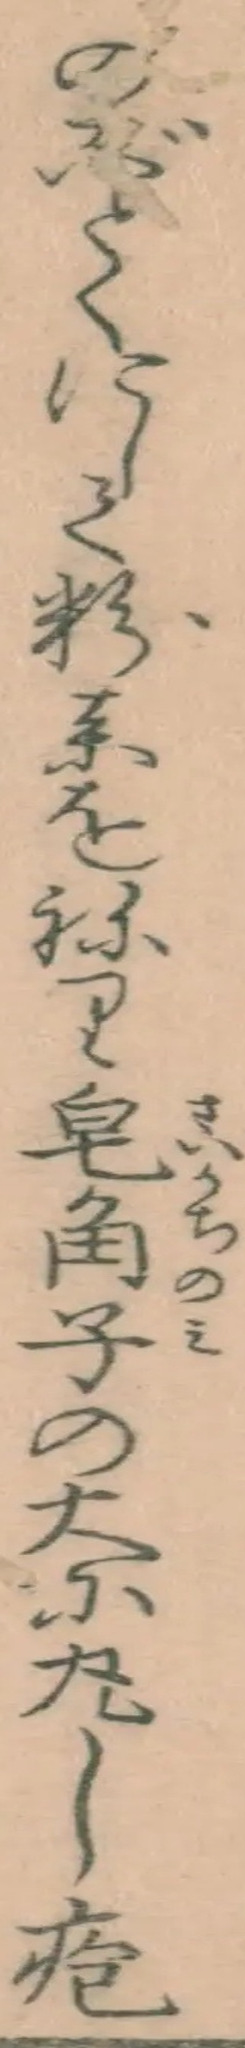のごとくにして粉薬をねり皂角子の大に丸し疱
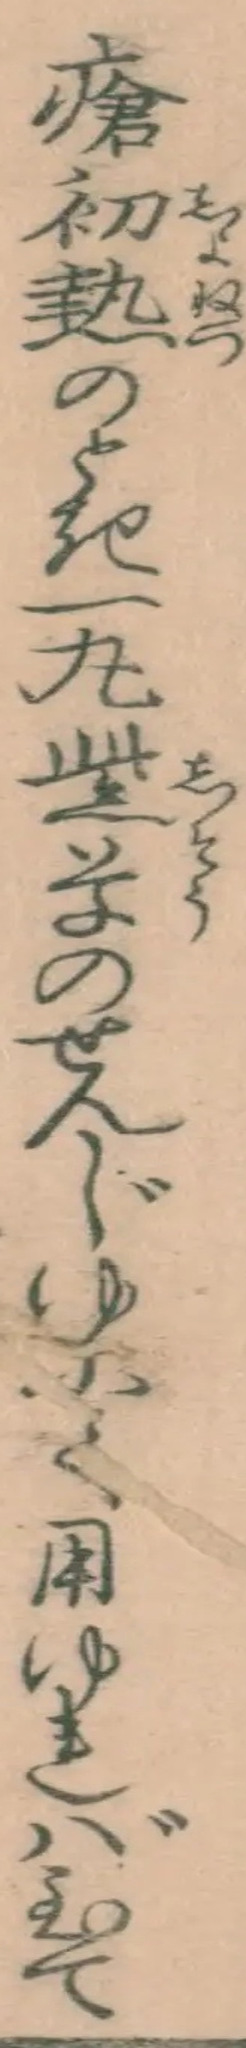瘡初熱のとき一丸紫草のせんじゆにて用ゆれば至て
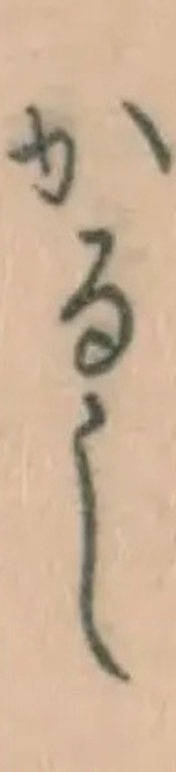かるし
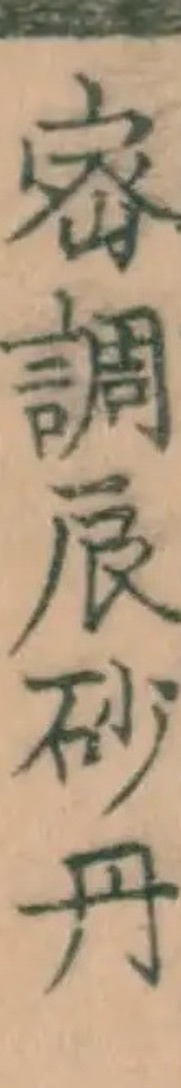密調辰砂丹
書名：雨夜談
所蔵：国立国会図書館 National Diet Library, JAPAN
